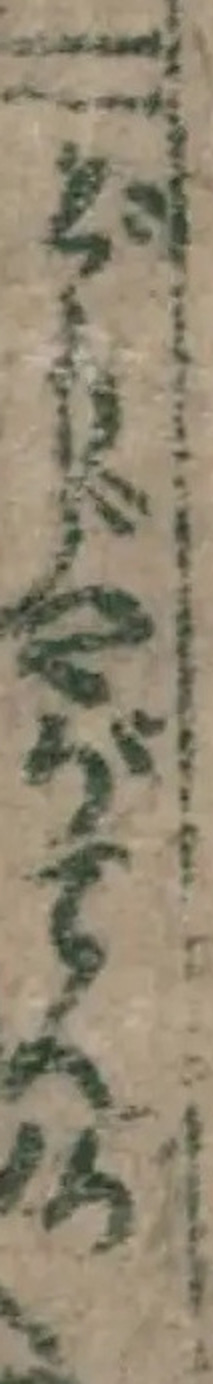どうじやがてんか
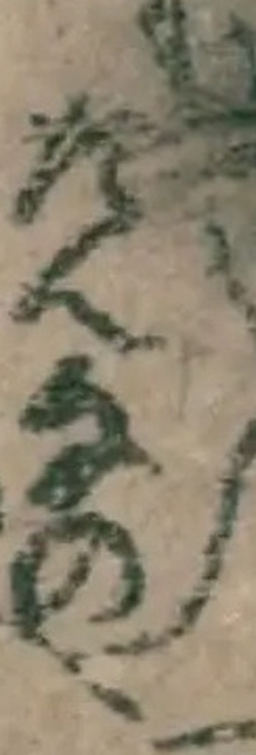だんなの
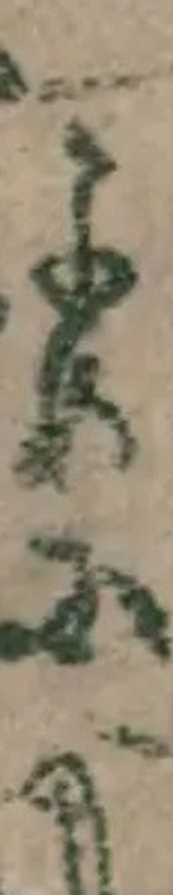よめに
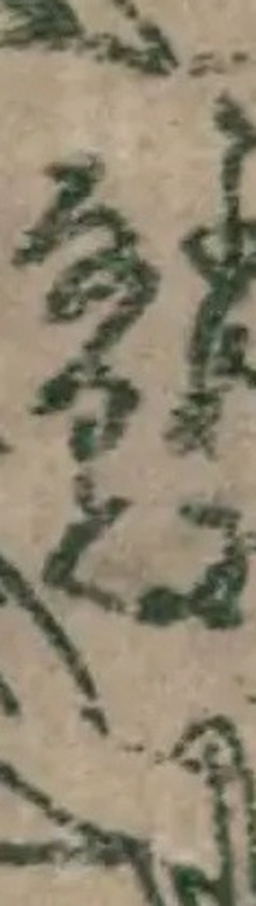なると
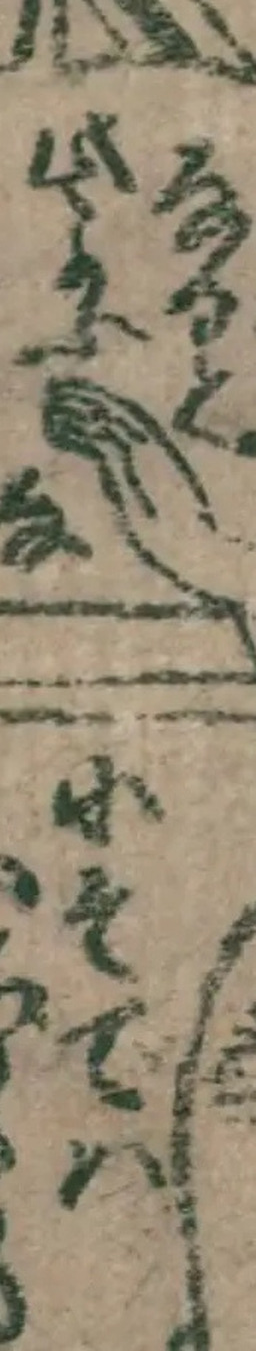此よふな小そでは
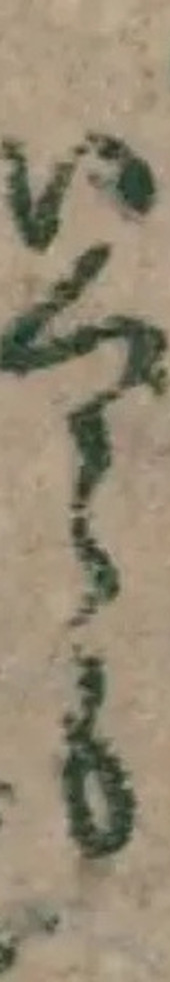いくらも
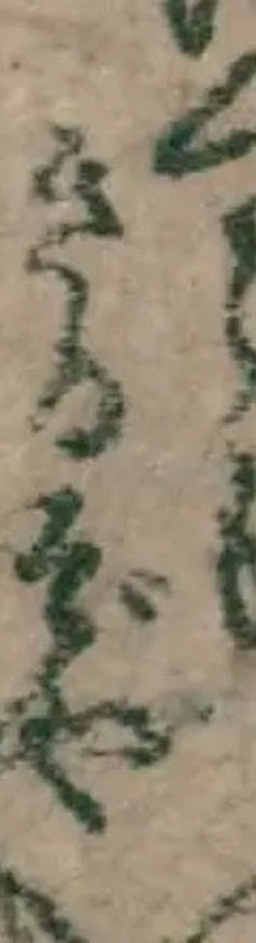きるぞや
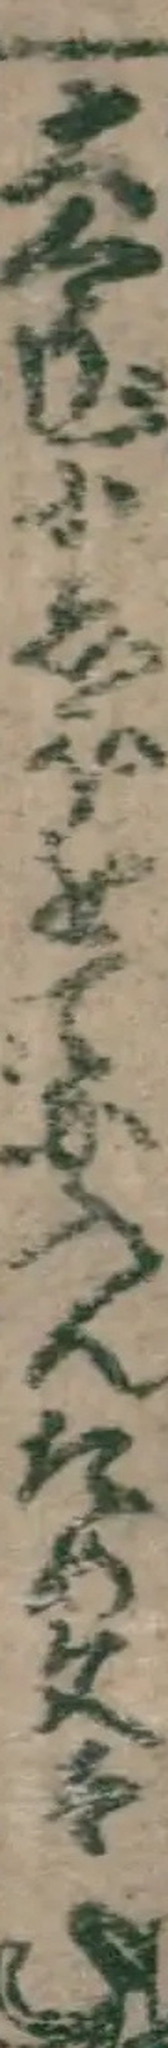大くうじ小しほをてに入んため文太
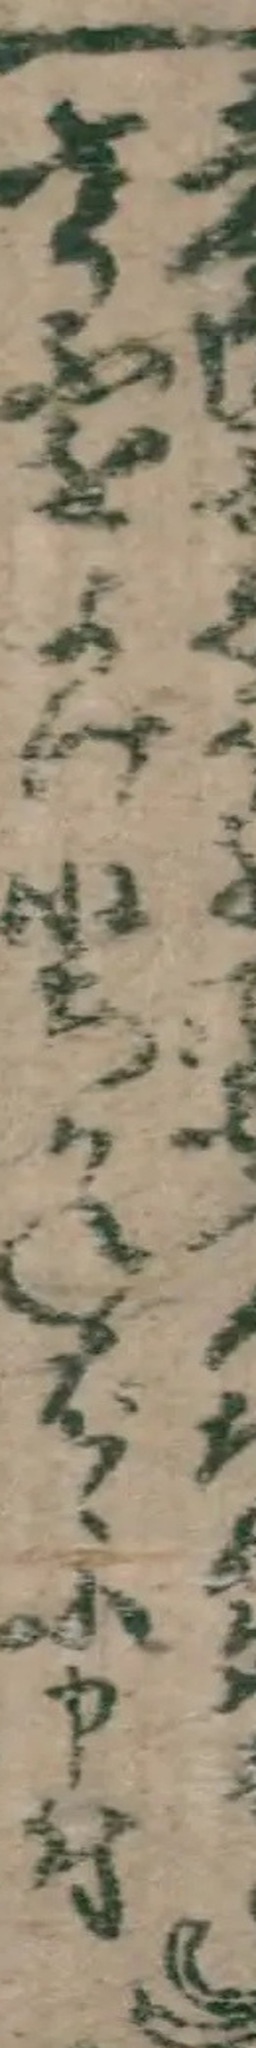ふうふをよけねぢかねばゝに申付
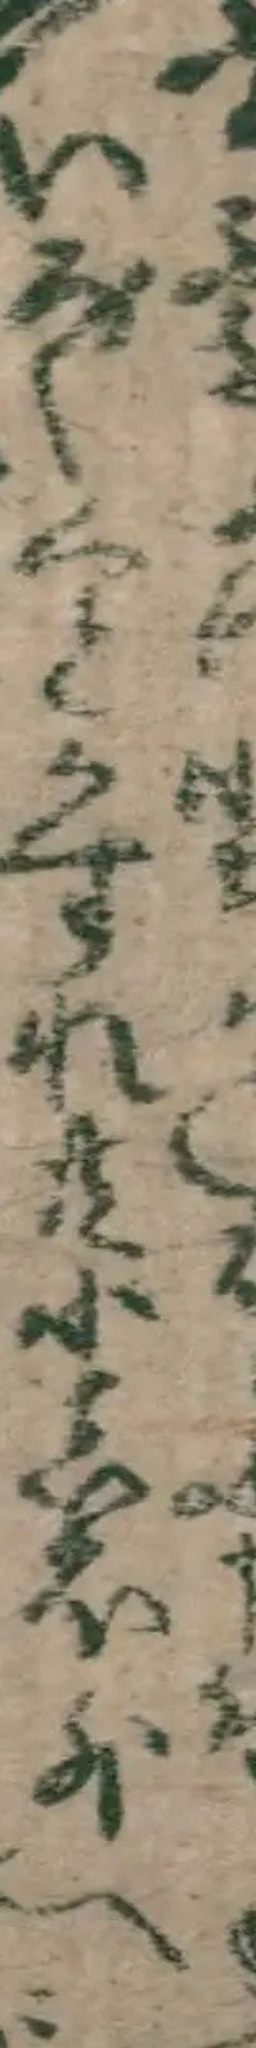おろ〳〵くとかすれ共小しほ外へ
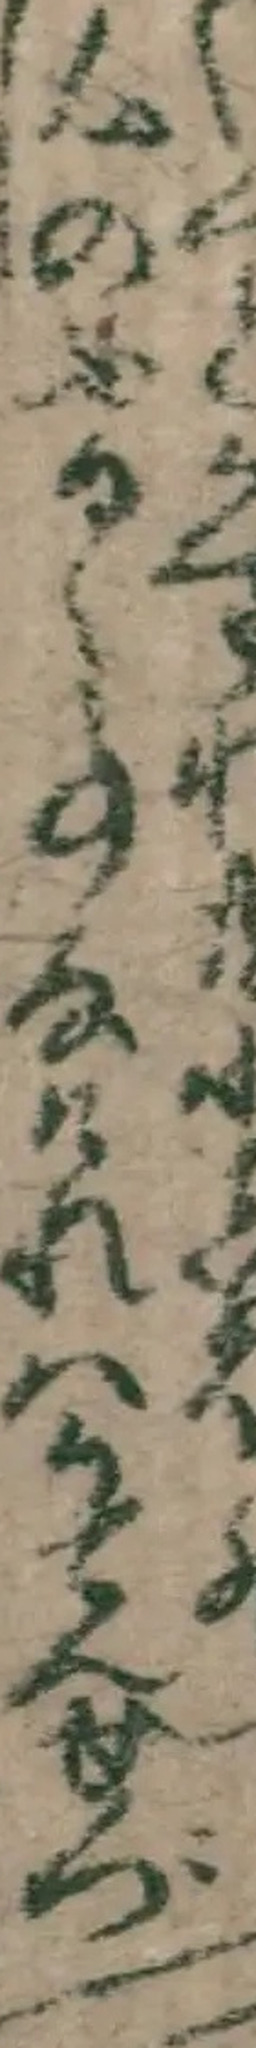心のゆるゝ事なけれはかてんせづ
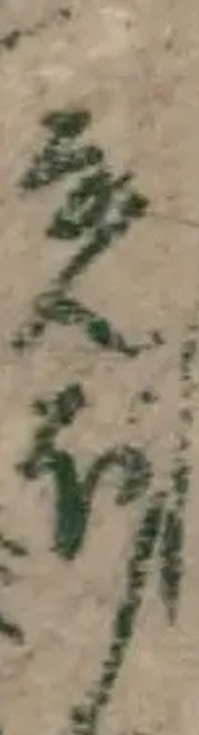なんぼ
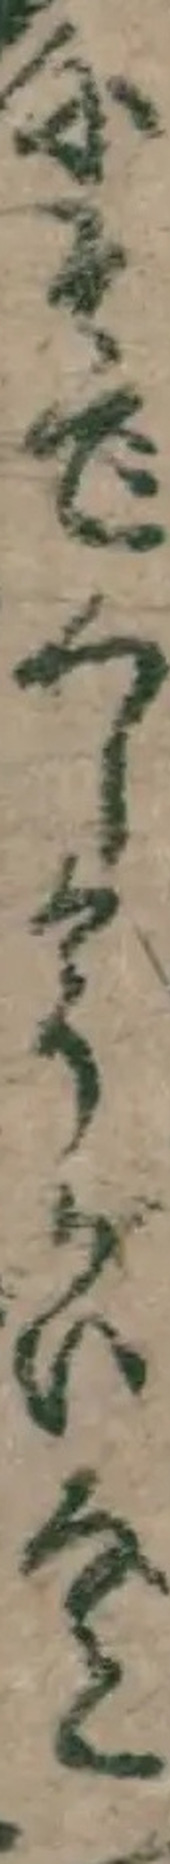小そでくしかうがいなと
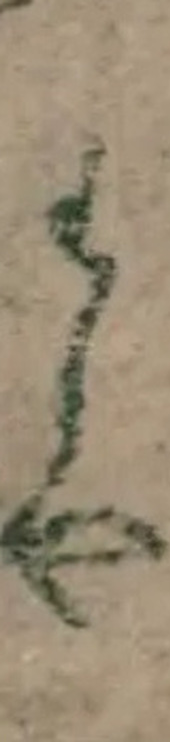わしや
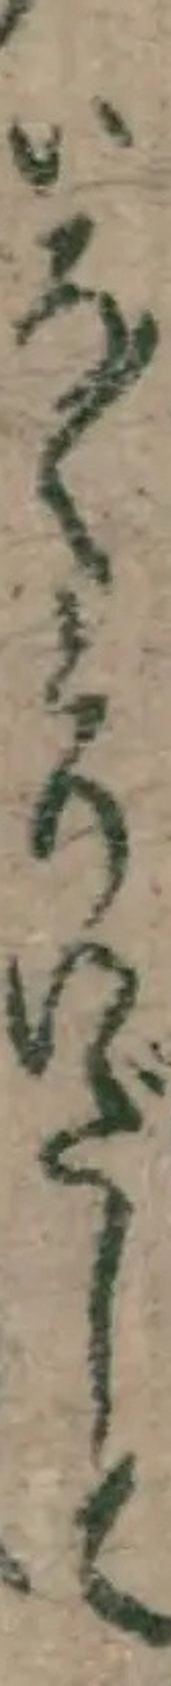いろ〳〵とりいだして
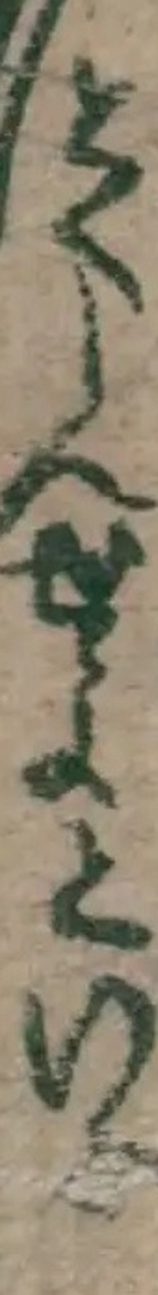とくしんせよといふ
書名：塩売文太物語 2巻
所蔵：国立国会図書館 National Diet Library, JAPAN
